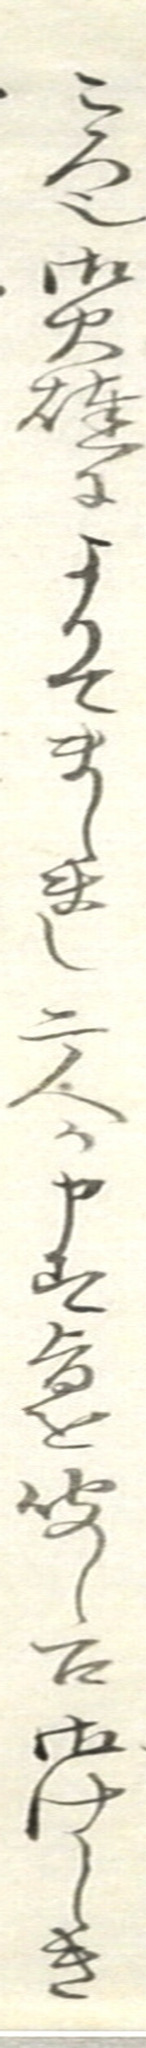ころ也御火燵によりてましまし二人か申す旨を聞し召御けしき

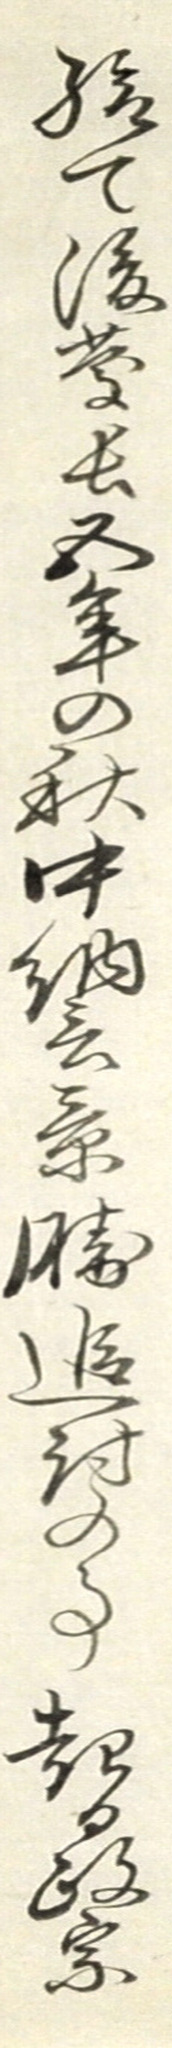給て後慶長五年の秋中納言景勝追討の事起る政宗
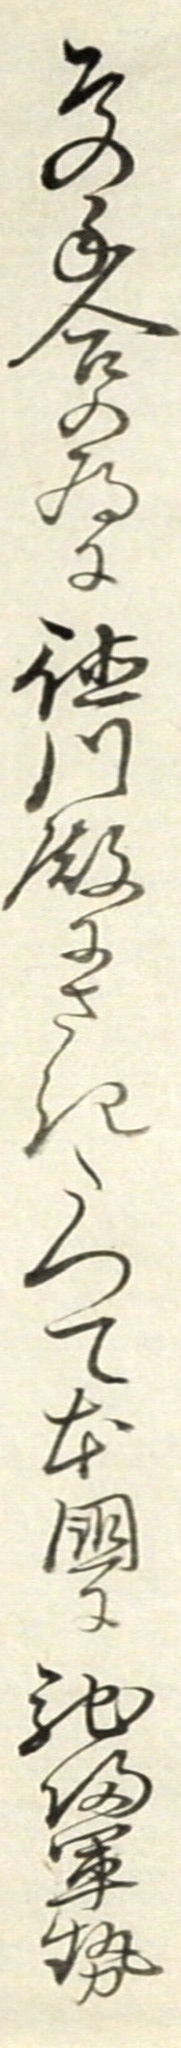その手合の為に徳川殿にさきたつて本国に馳帰軍勢
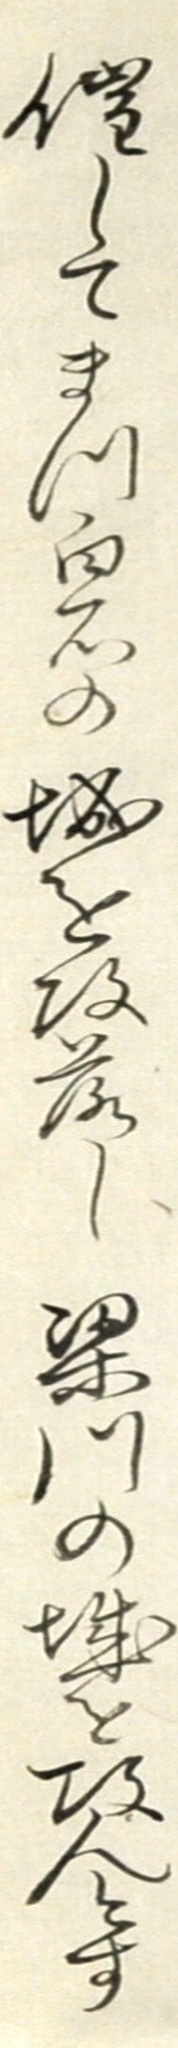催してまつ白石の城を攻落し梁川の城を攻んとす
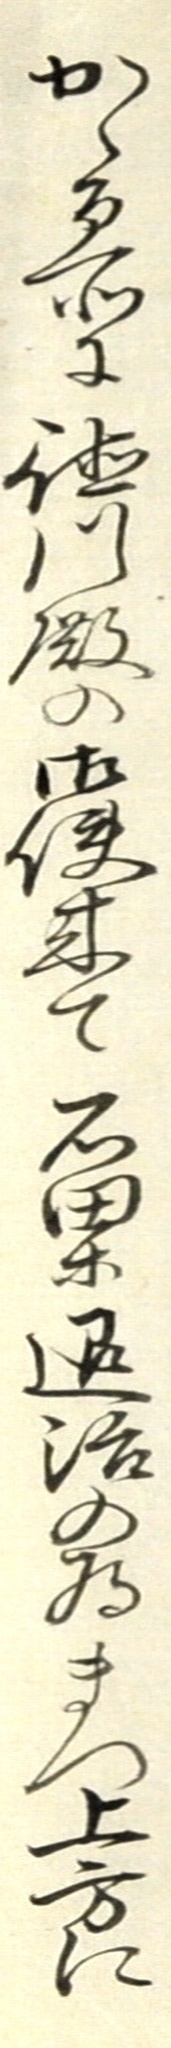かゝる所に徳川殿の御使来て石田等退治の為まつ上方に

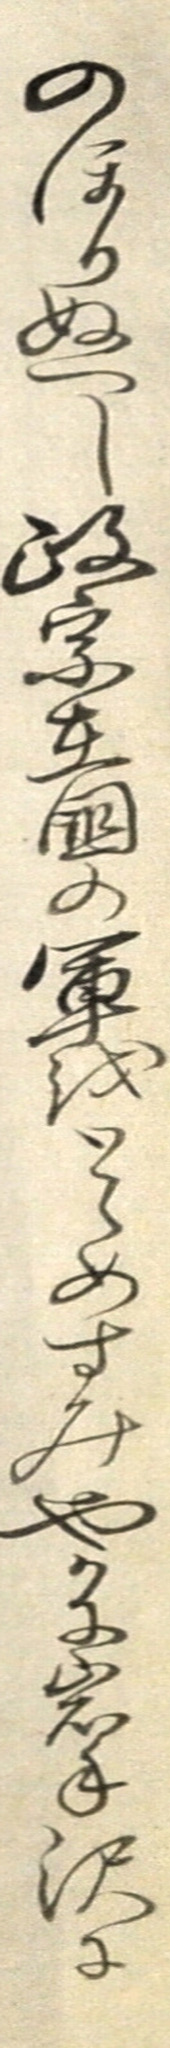のほりぬへし政宗在国の軍をとゝめすみやかに岩手沢に
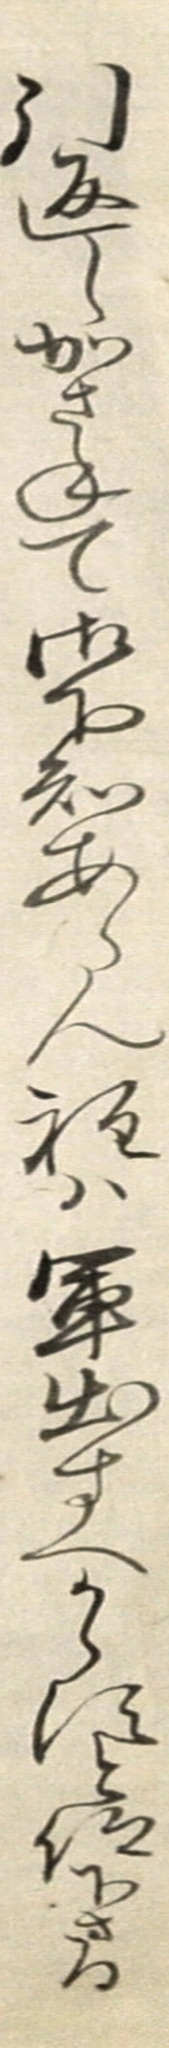引返しかさねて御下知あらん程は軍出すへからすと仰下さる
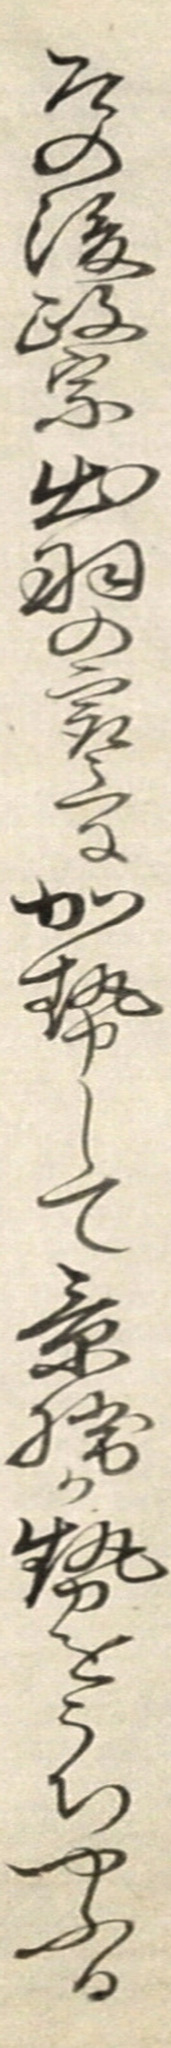その後政宗出羽の最上に加勢して景勝か勢をうちやふる
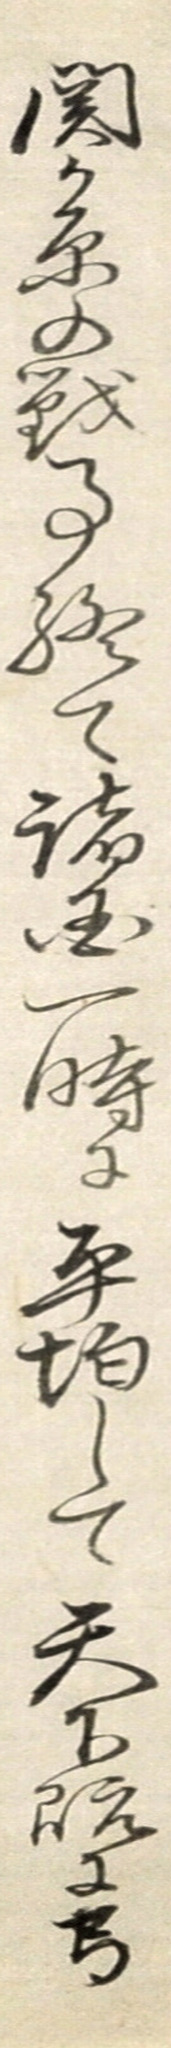関ゕ原の戦事終て諸国一時に平怕して天下既に弓
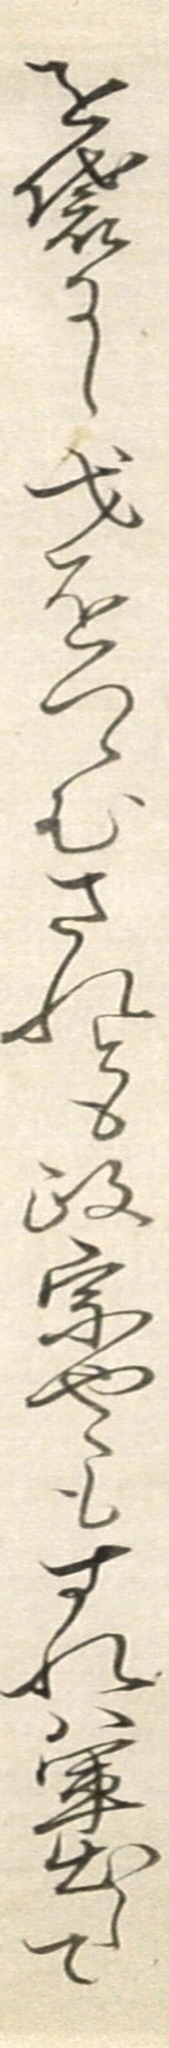を袋にし戈をつゝむされとも政宗やゝもすれは軍出して
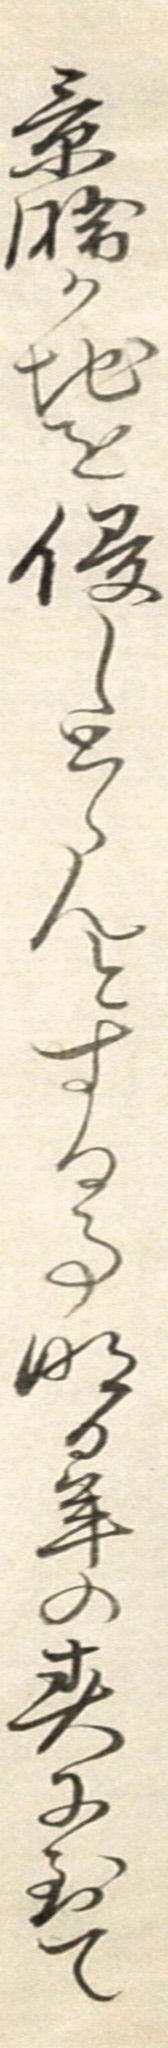景勝か地を侵しとらんとする事明る年の春に至て
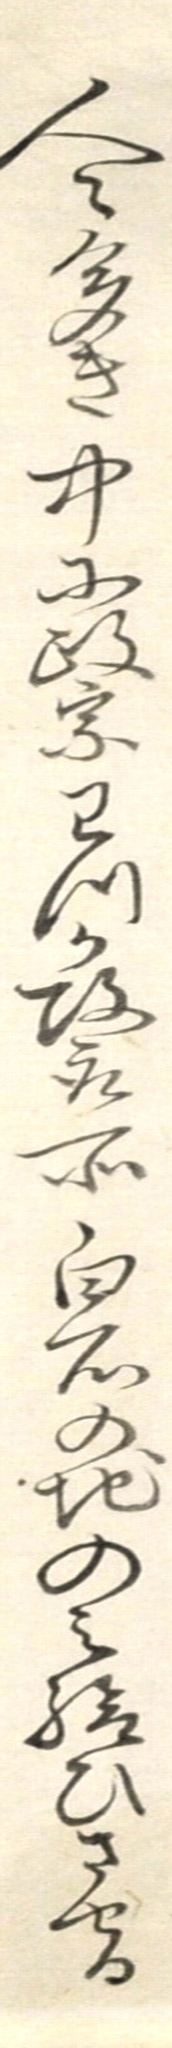人々多き中に政宗わつか攻取所白石の地のみ給ひさせる
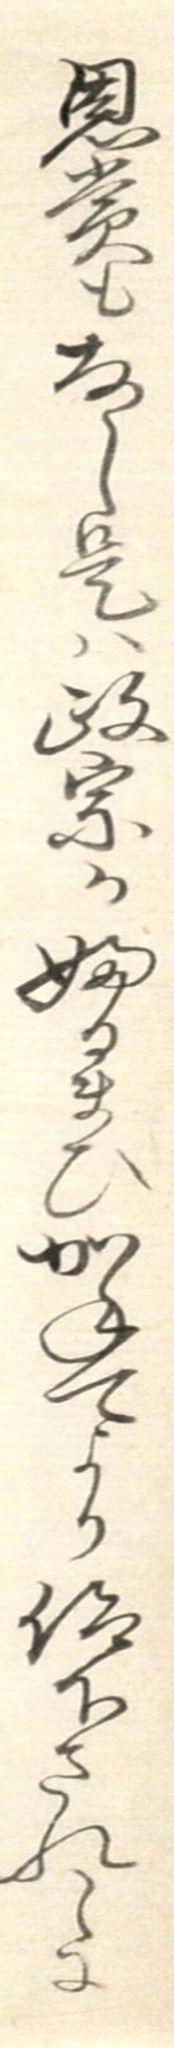恩賞もなし是は政宗かふるまひかねてより仰下されしに
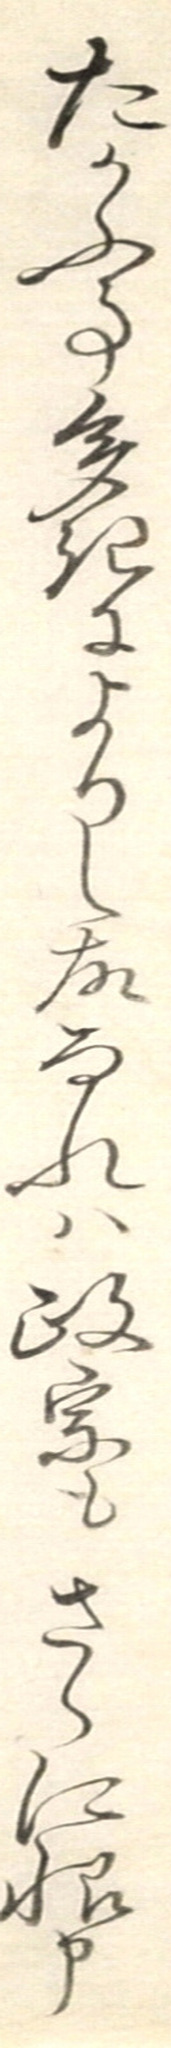たかふ事多きによりし故なれは政宗もさらに恨申
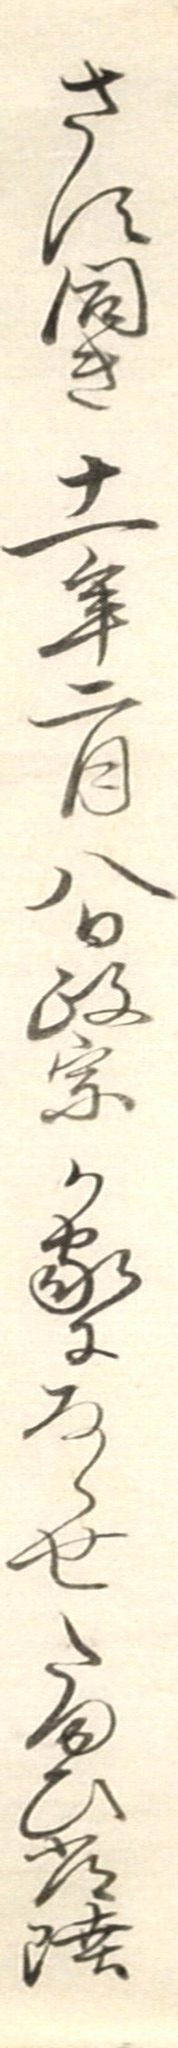さす同き十一年二月八日政宗か家にならせたまひ常陸
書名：藩翰譜（七・下）
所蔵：伊那市立高遠町図書館・合同会社AMANE
